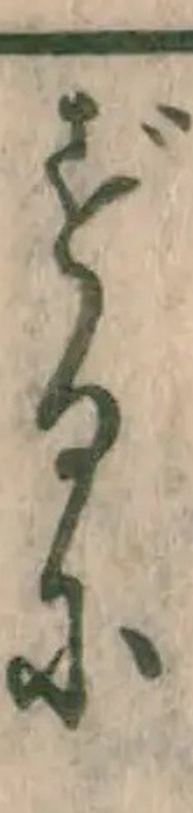ずるに

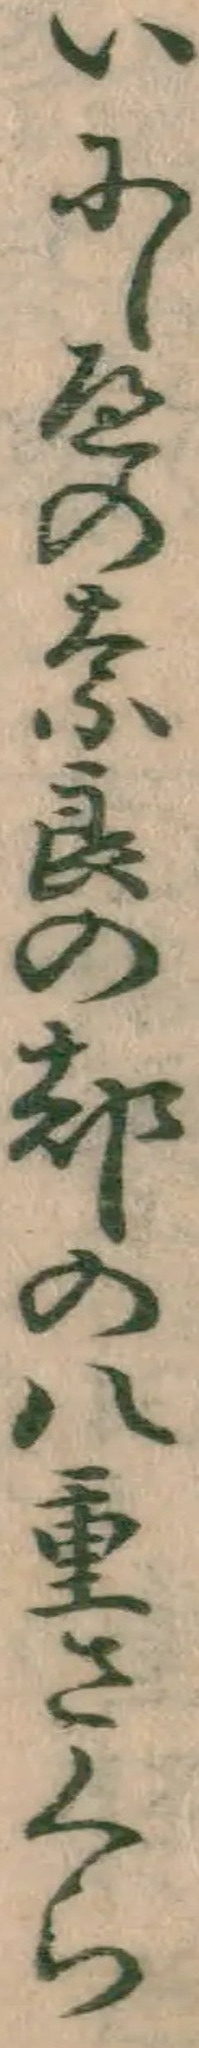いにしへの奈良の都の八重さくら
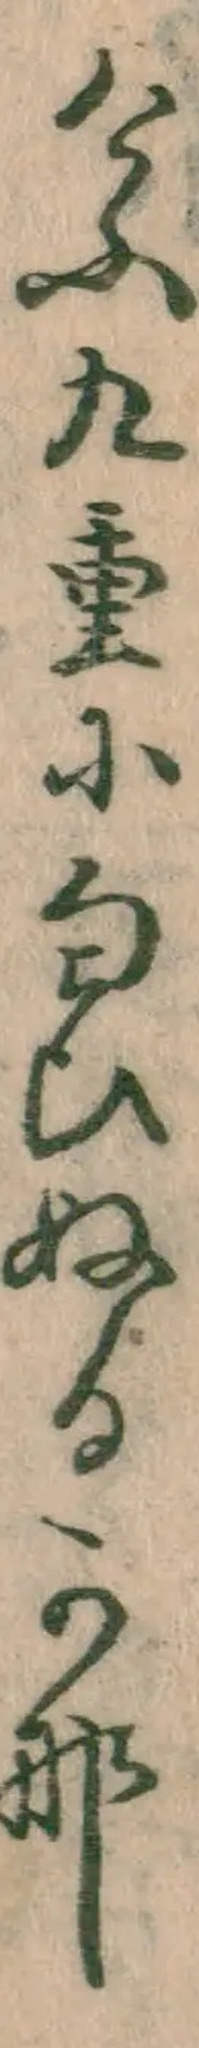けふ九重に匂ひぬるかな
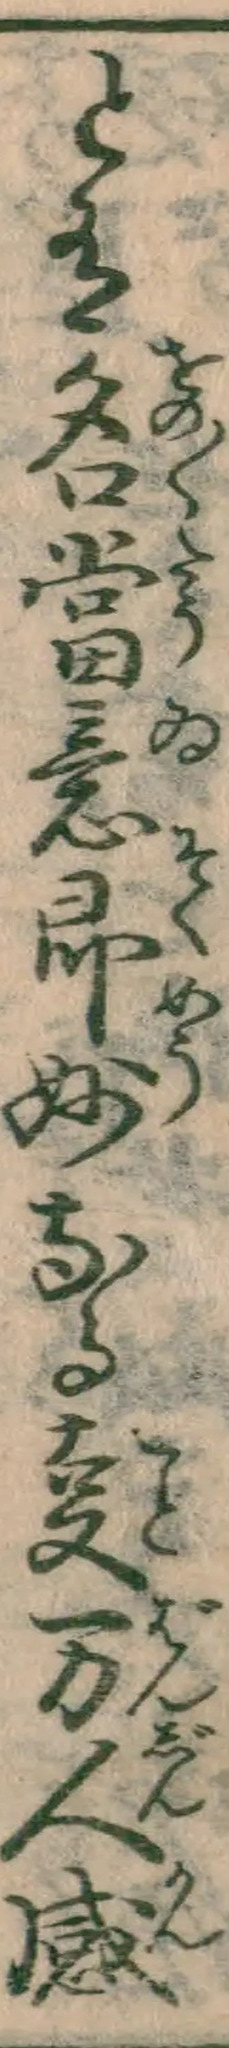と有各当意即妙なる事万人感
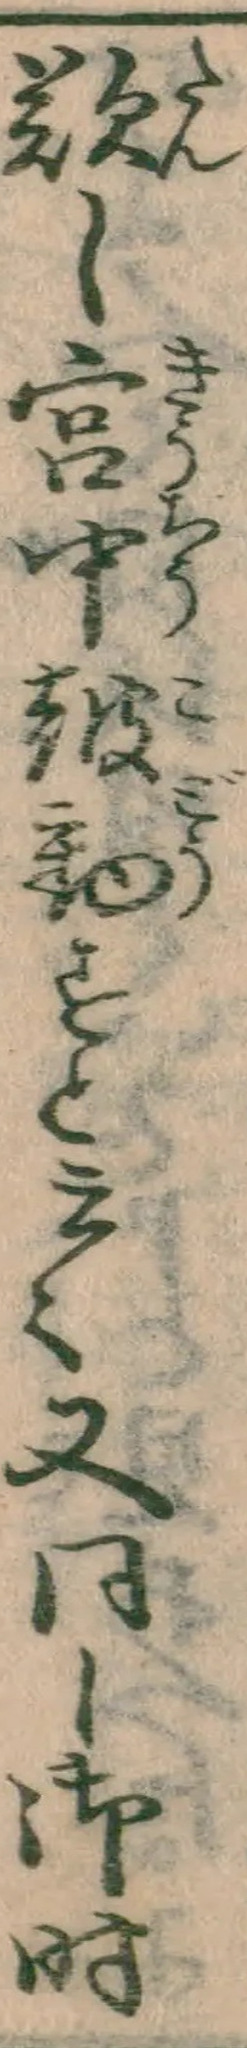歎し宮中鼓動すと云々又同し御時
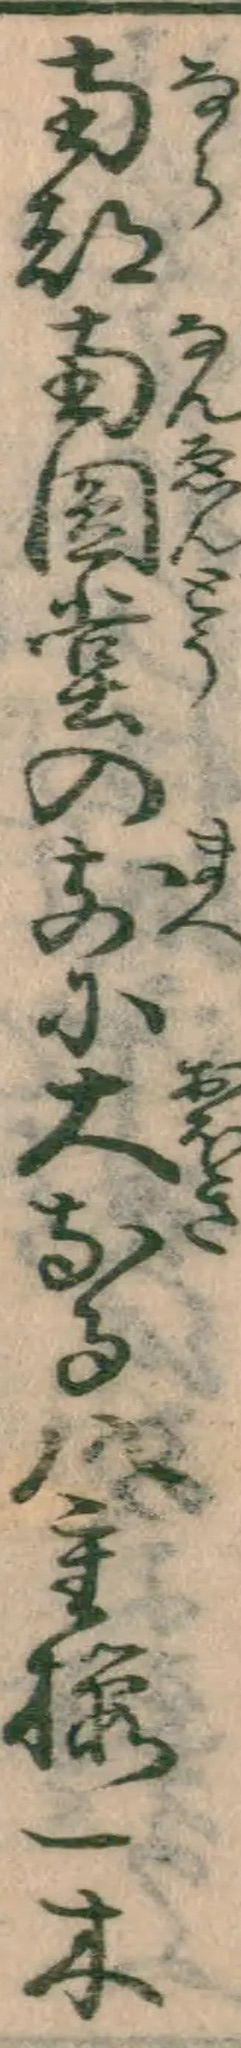南都南円堂の前に大なる八重桜一木
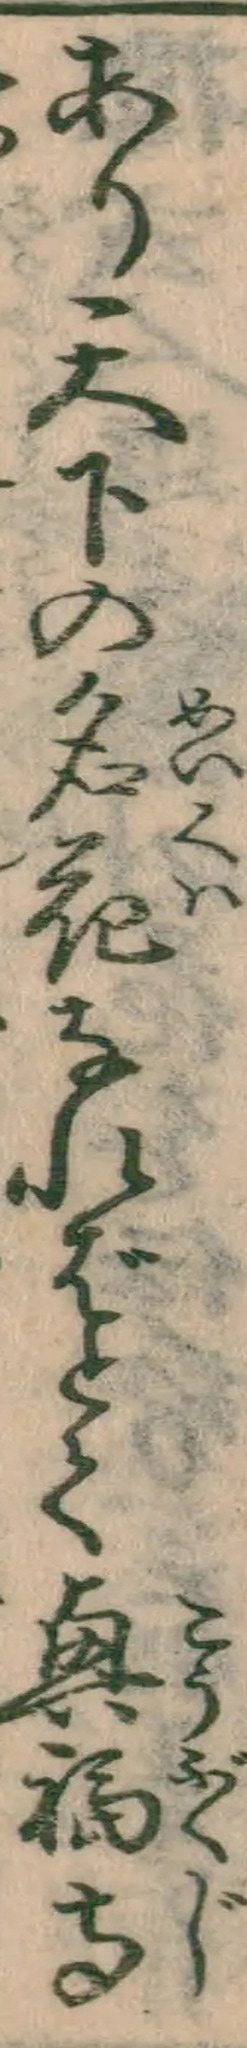あり天下の名花なればとて興福寺
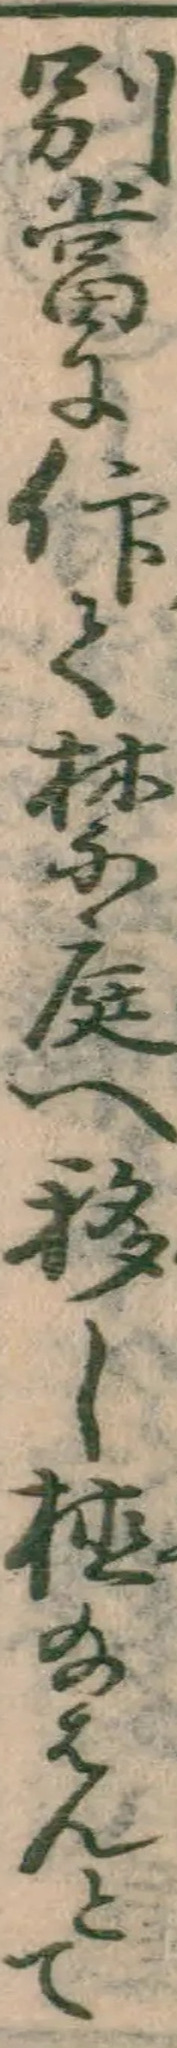別当に仰て禁庭へ移し植給はんとて
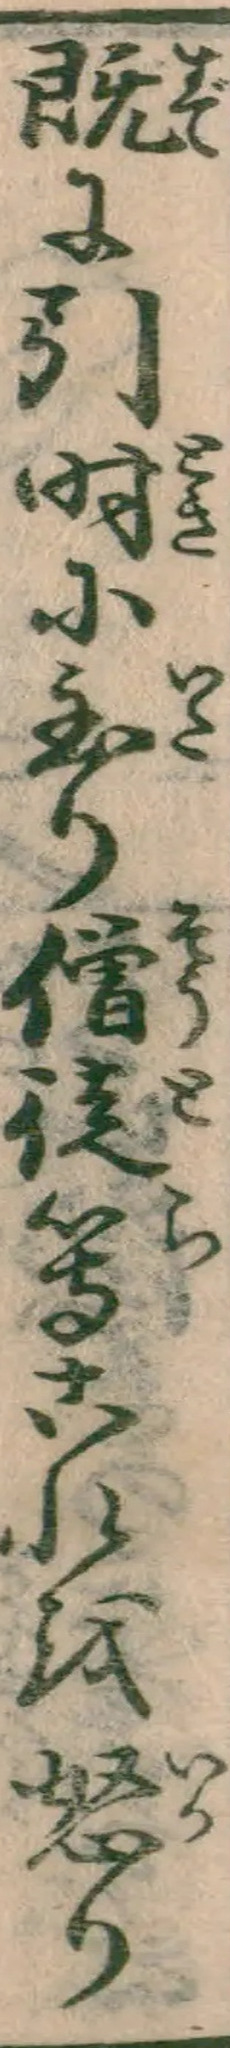既に引時に至り僧徒等これを怒り
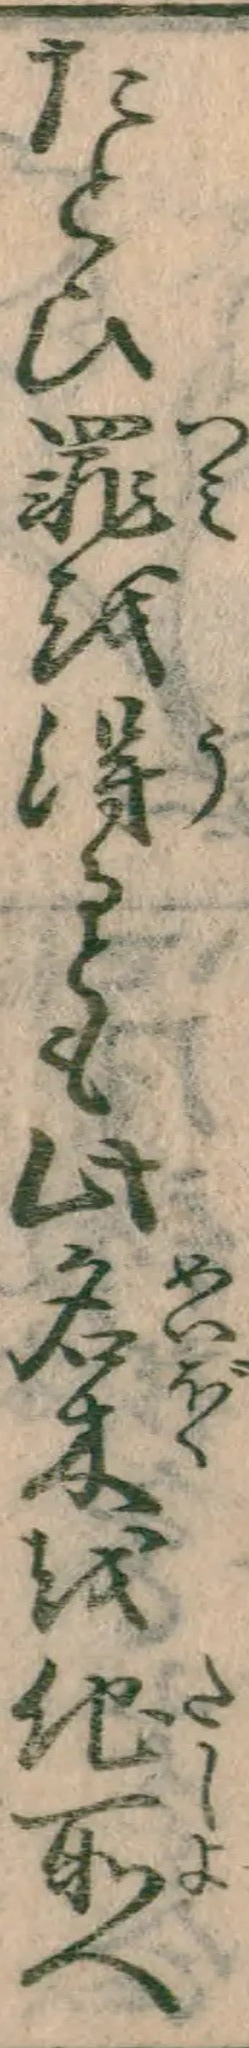たとひ罪を得るとも此名木を他所へ
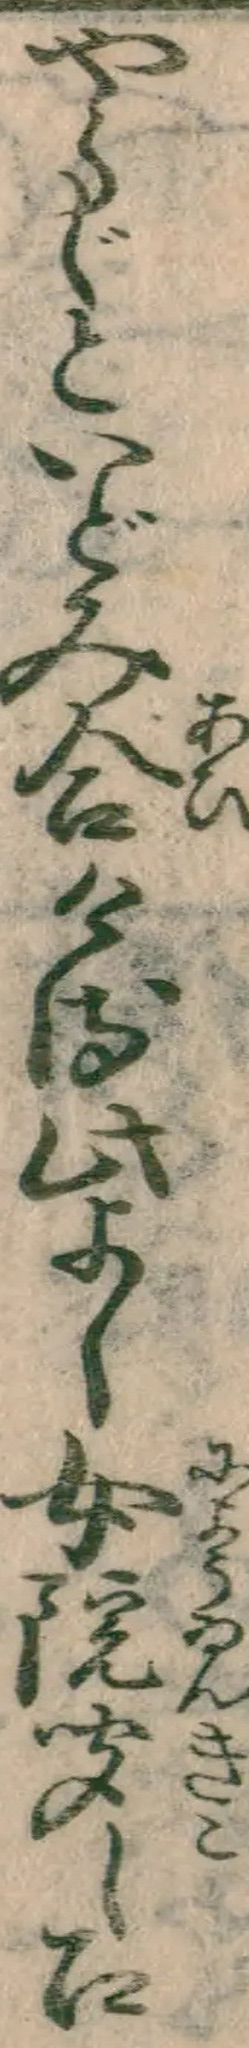やらじといどみ合ける此よし女院聞し召
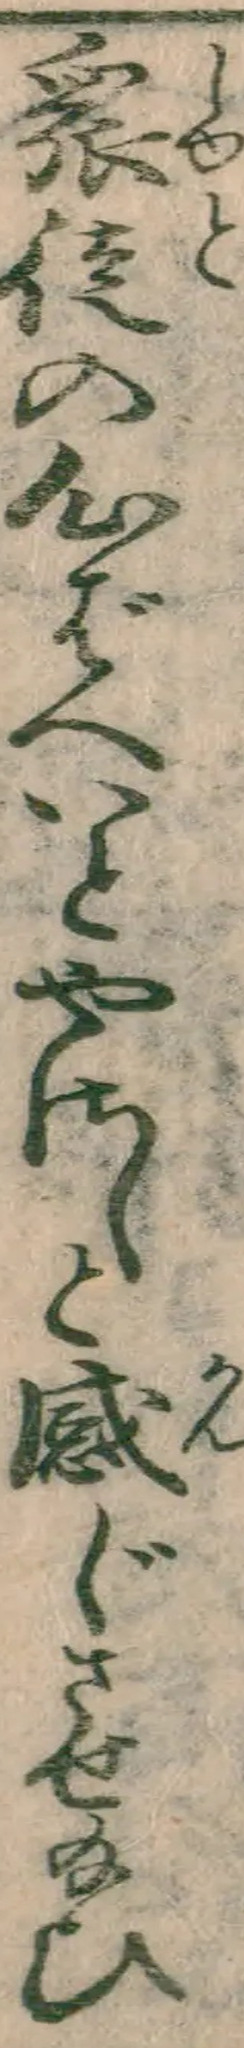衆徒の心ばへいとやさしと感じさせ給ひ
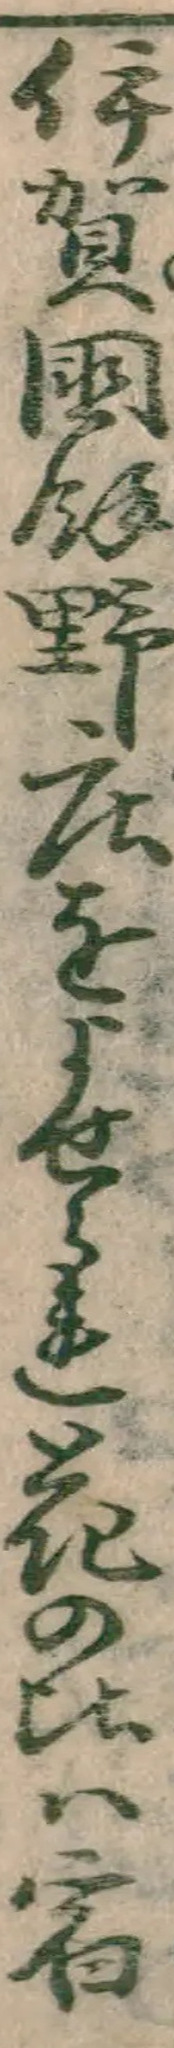伊賀国余野庄をよせられ花の比は宿
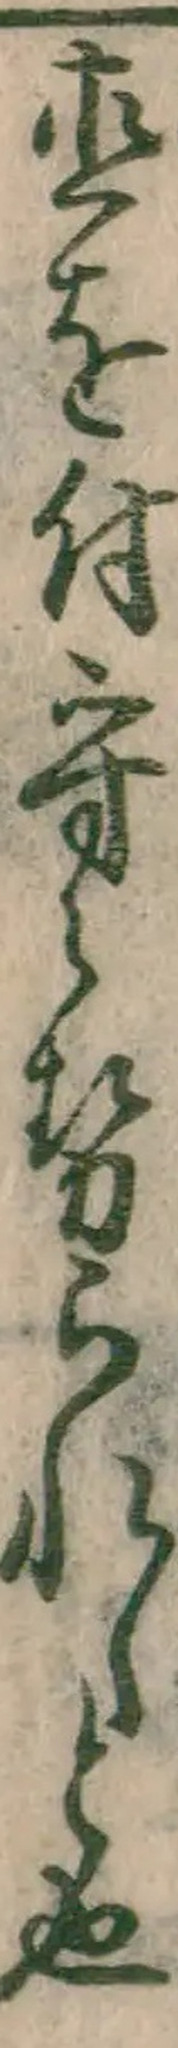直を付守らせられしと也

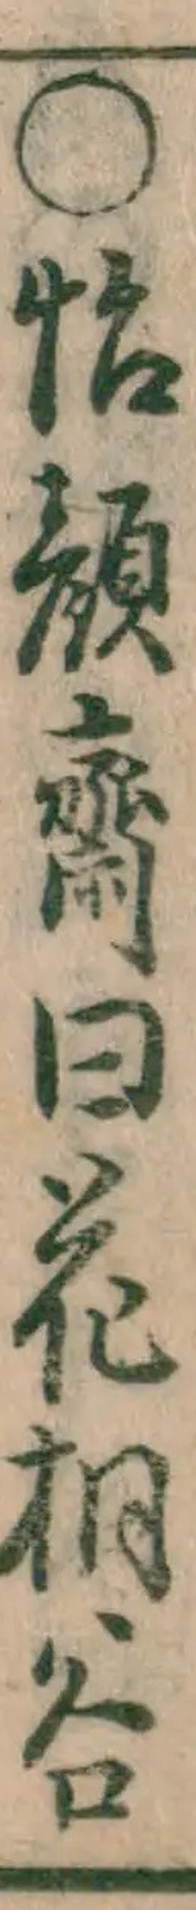○怡顔斎曰花桐谷
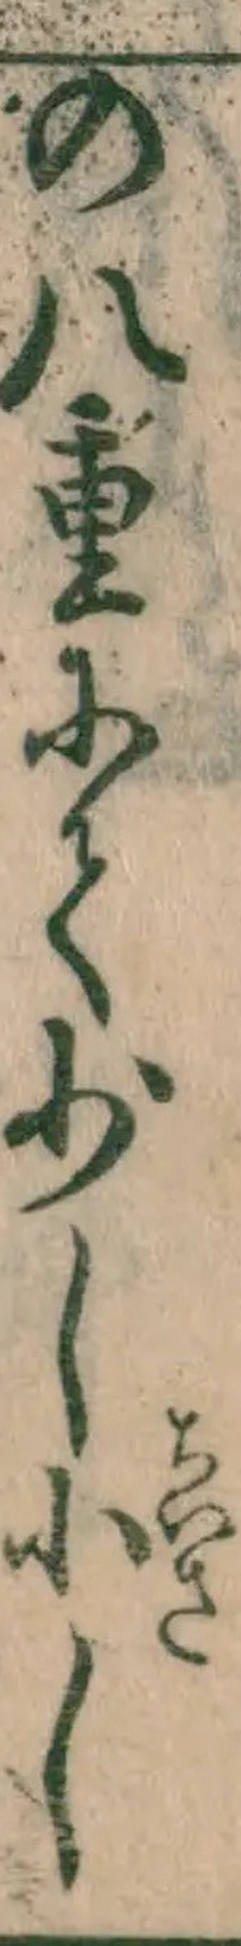の八重にて少し小し
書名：怡顔齋櫻品
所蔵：国立国会図書館 National Diet Library, JAPAN
